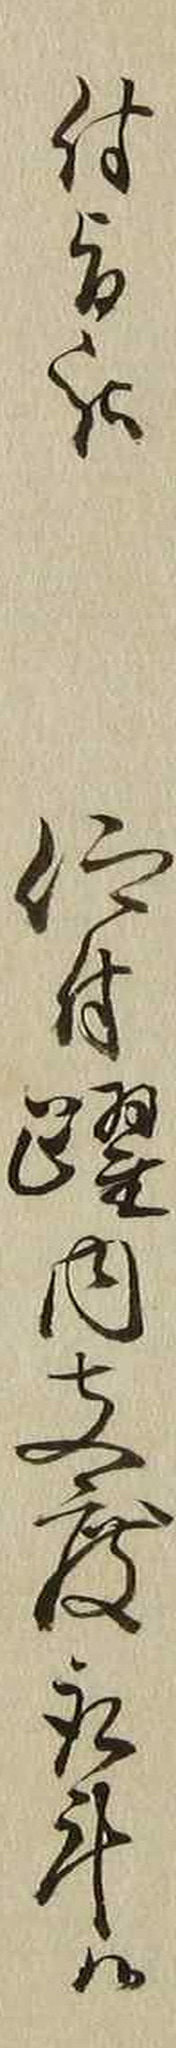付旨被仰付躍内支度取計候
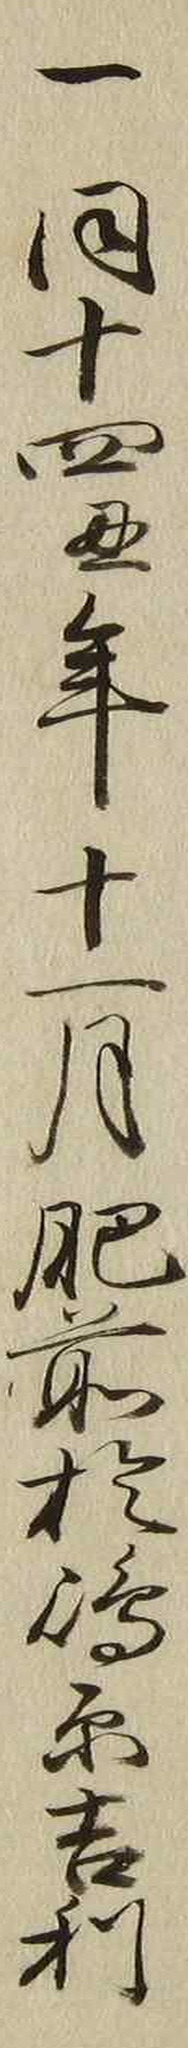一同十四丑年十一月肥前於島原吉利
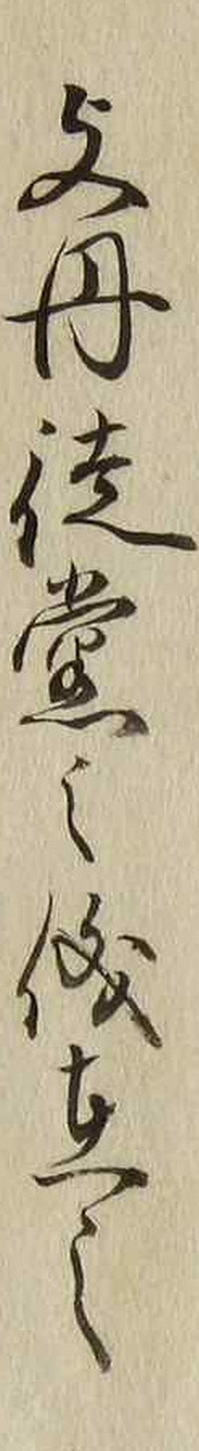支丹徒党之儀在之
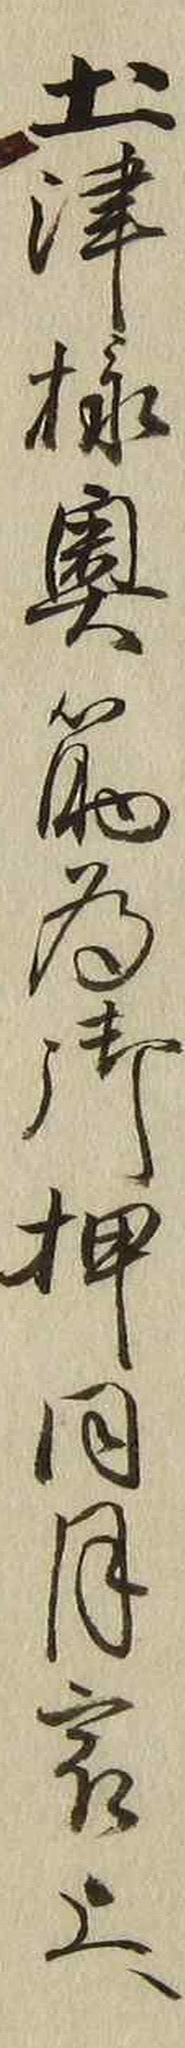土津様奥筋為御押同月最上へ
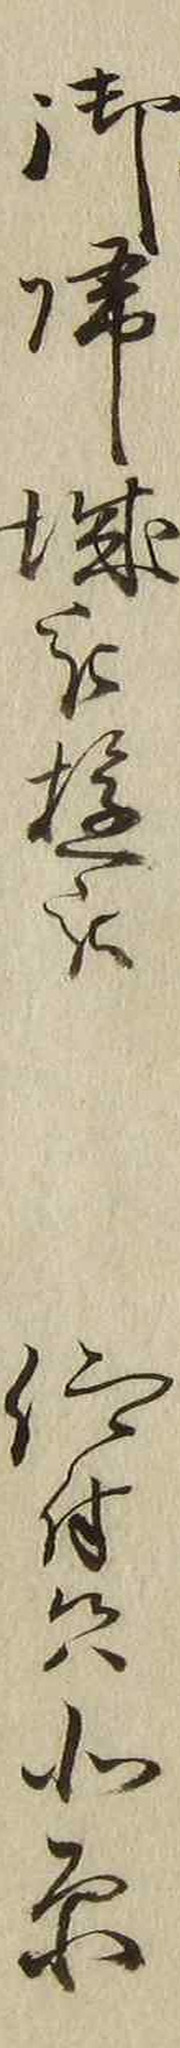御帰城被遊被仰付候ハ北原
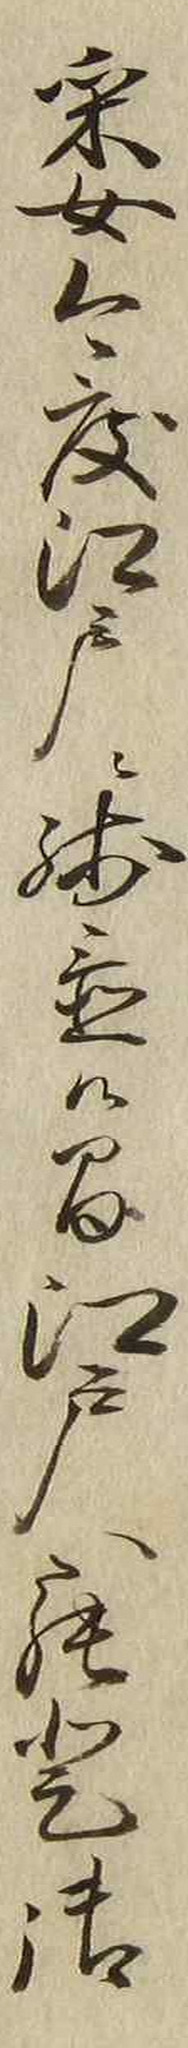采女今度江戸ニ残置候間江戸へ罷登御
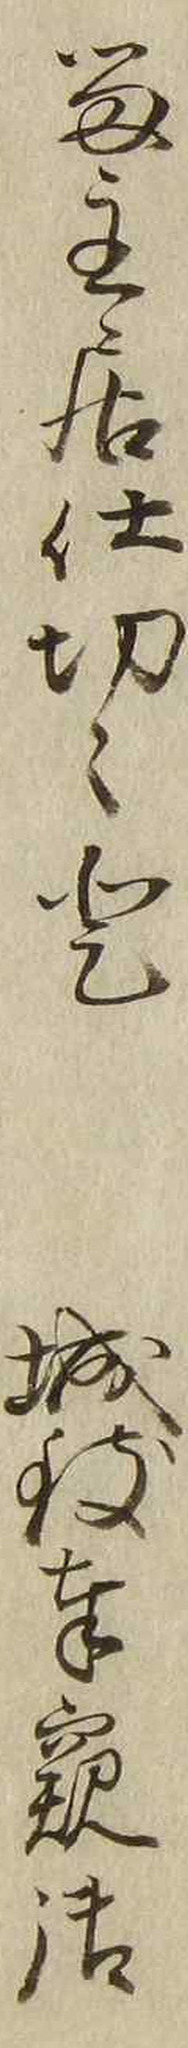留主居仕切々登城致奉窺御
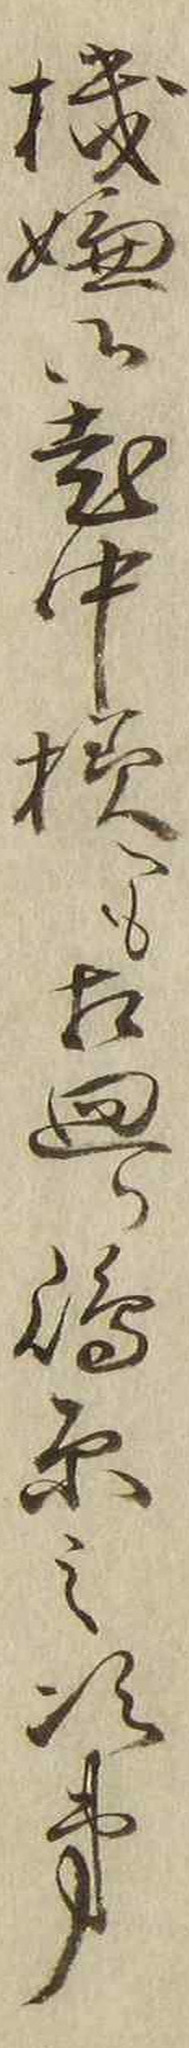機嫌御老中様へも相廻り島原之次第

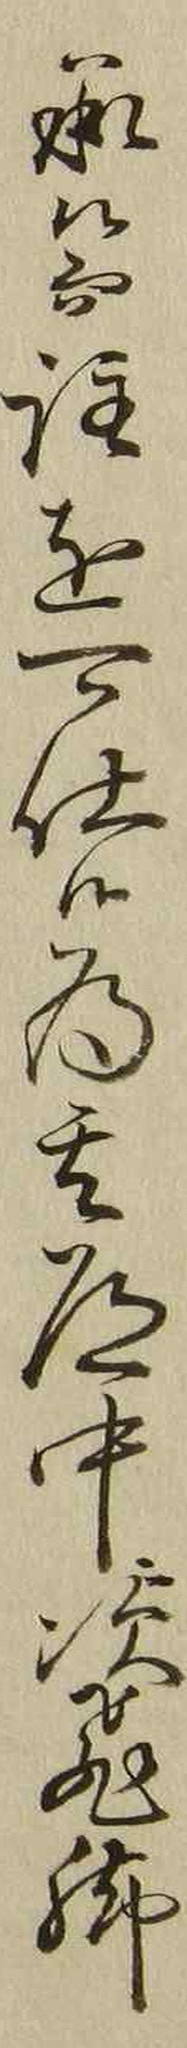承候而注進可仕候為其道中ニ次飛脚
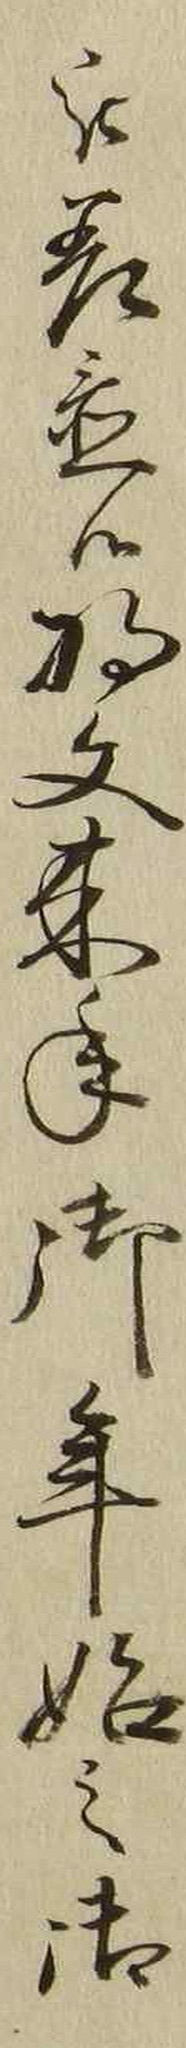被差置候将文来年御年始之御
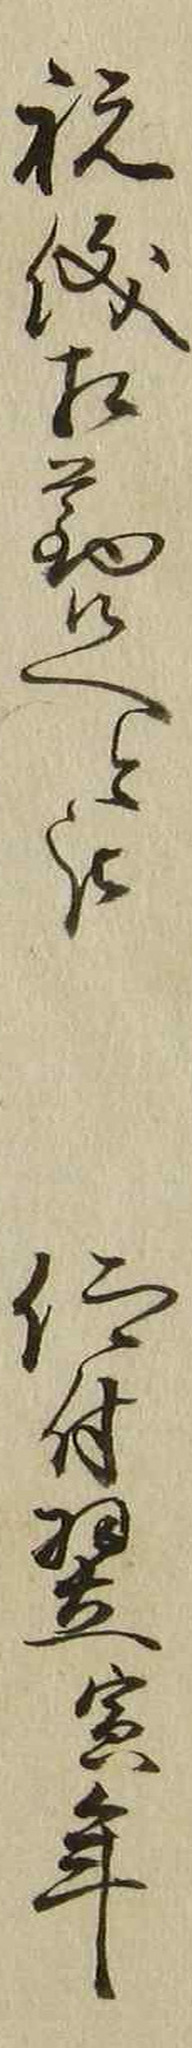祝儀相勤候へと被仰付翌寅年
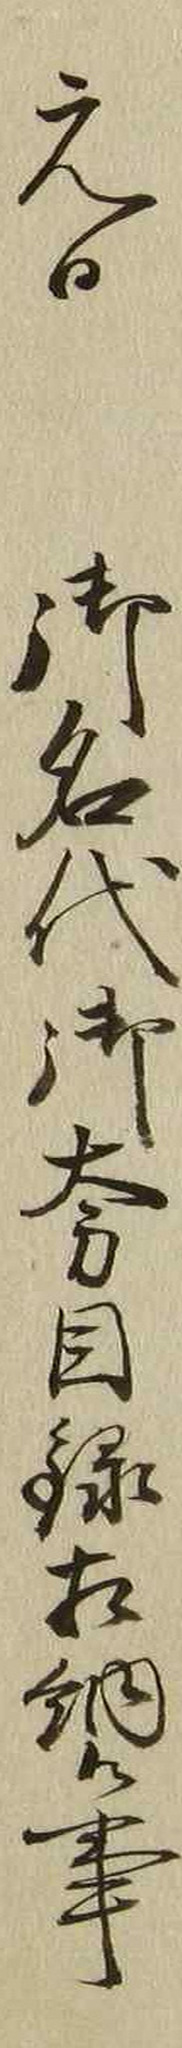元日御名代御太刀目録相納候事
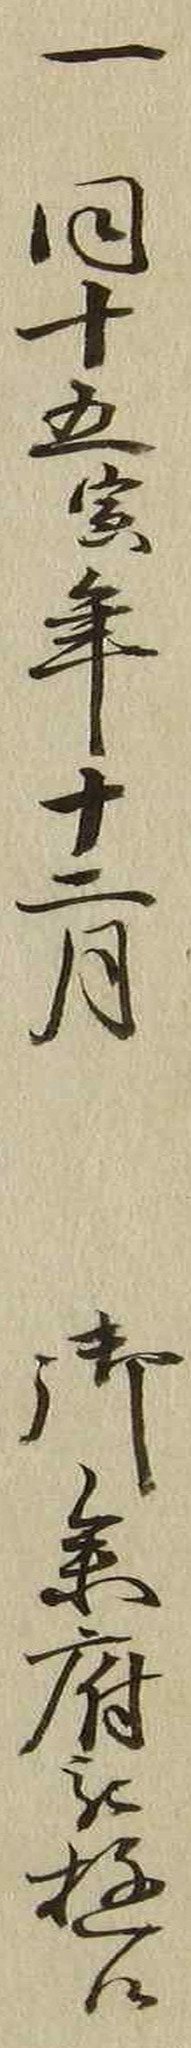一同十五寅年十二月御参府被遊候
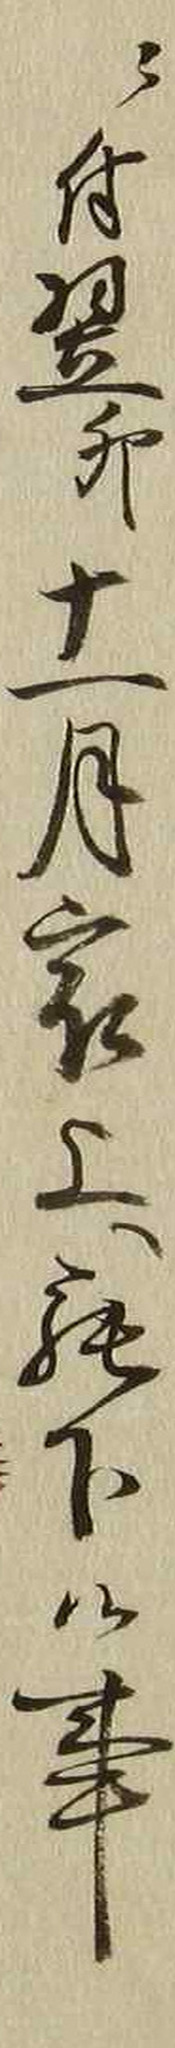ニ付翌卯十一月最上へ罷下候事
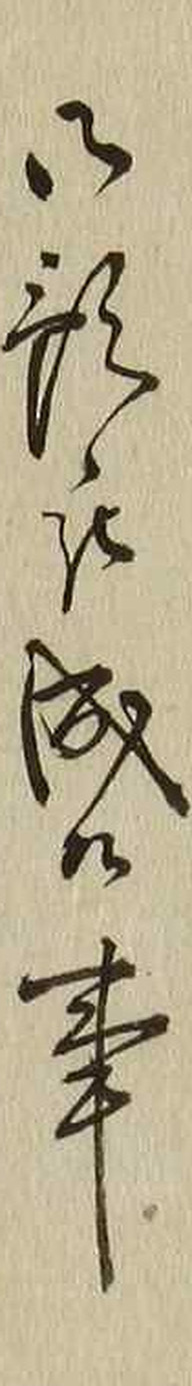御預被成候事
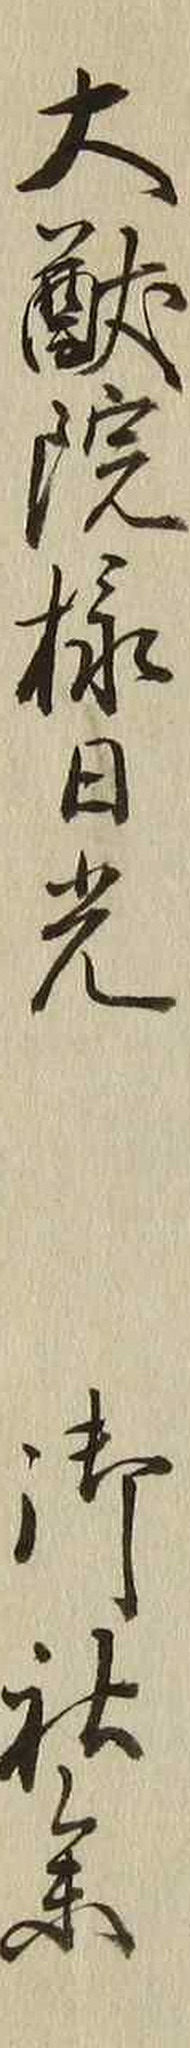大猷院様日光御社参
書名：諸士系譜　巻之60　と之部3
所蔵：会津若松市立会津図書館
